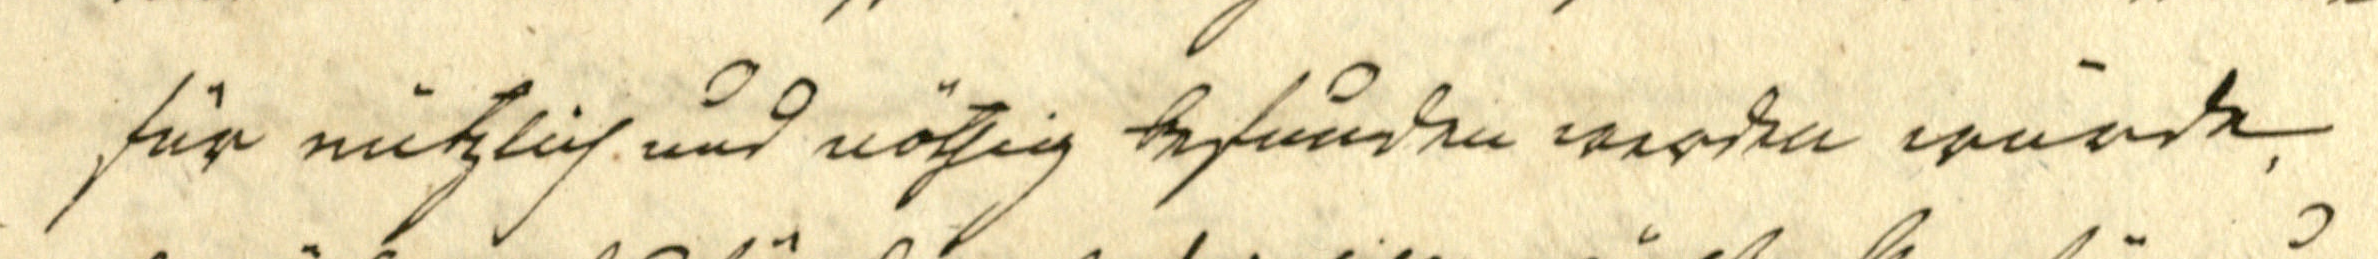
für nützlich und nöthig befunden werden würde,
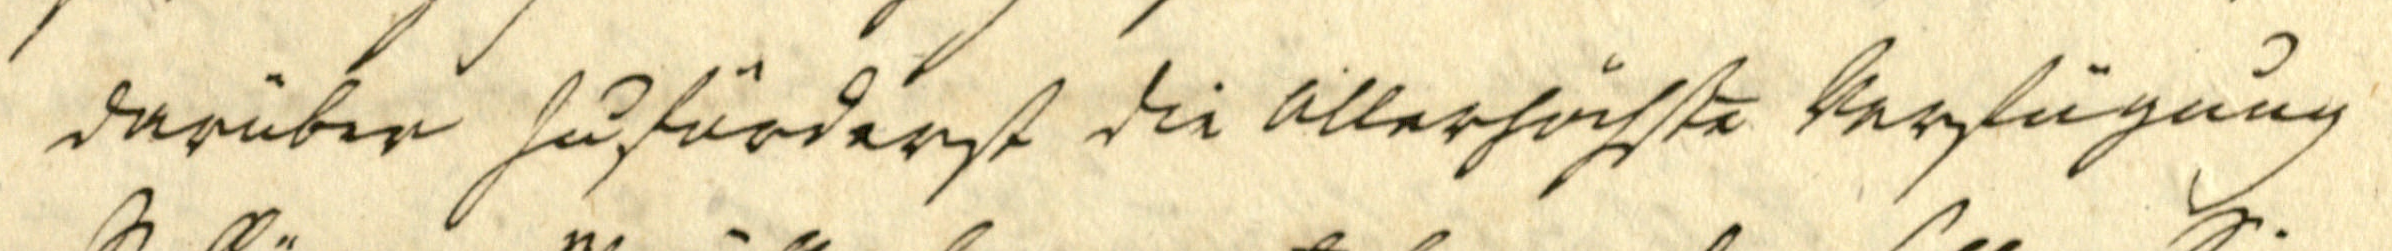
darüber zuförderst die Allerhöchste Verfügung
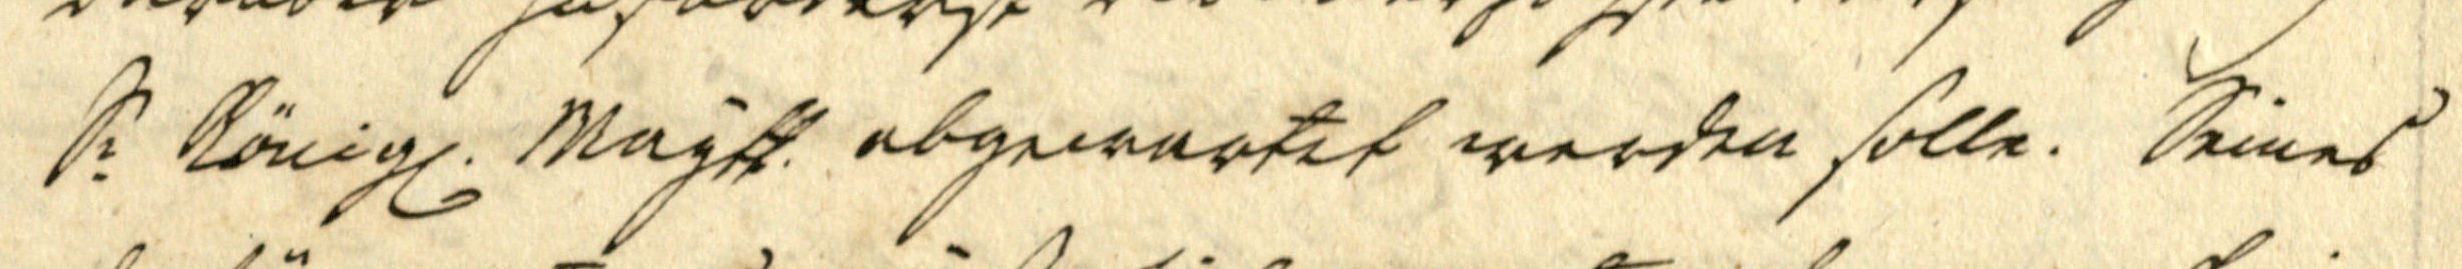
Sr. Königl. Maÿtt. abgewartet werden solle. Seines
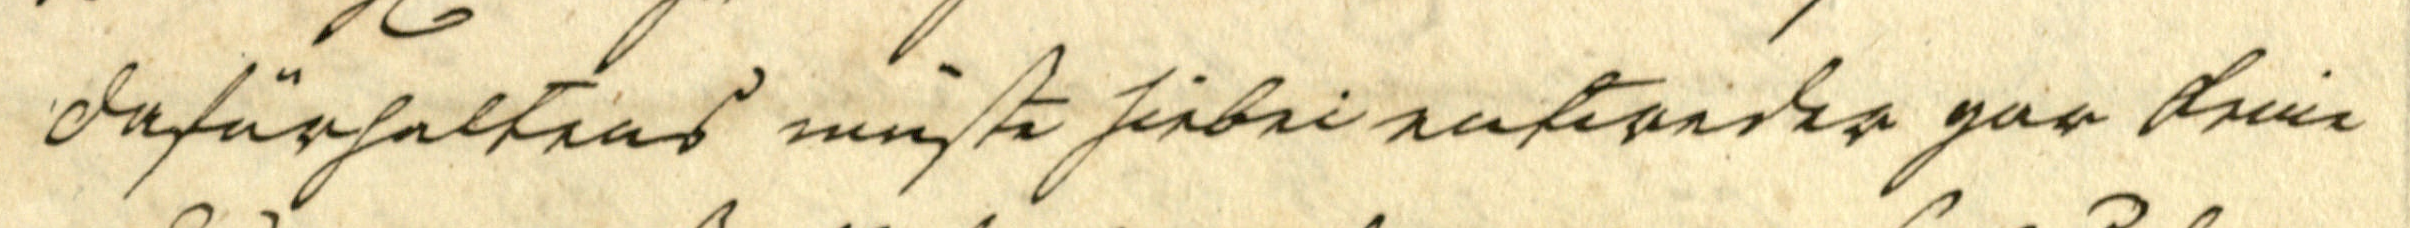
Dafürhaltens müßte hiebei entweder gar keine
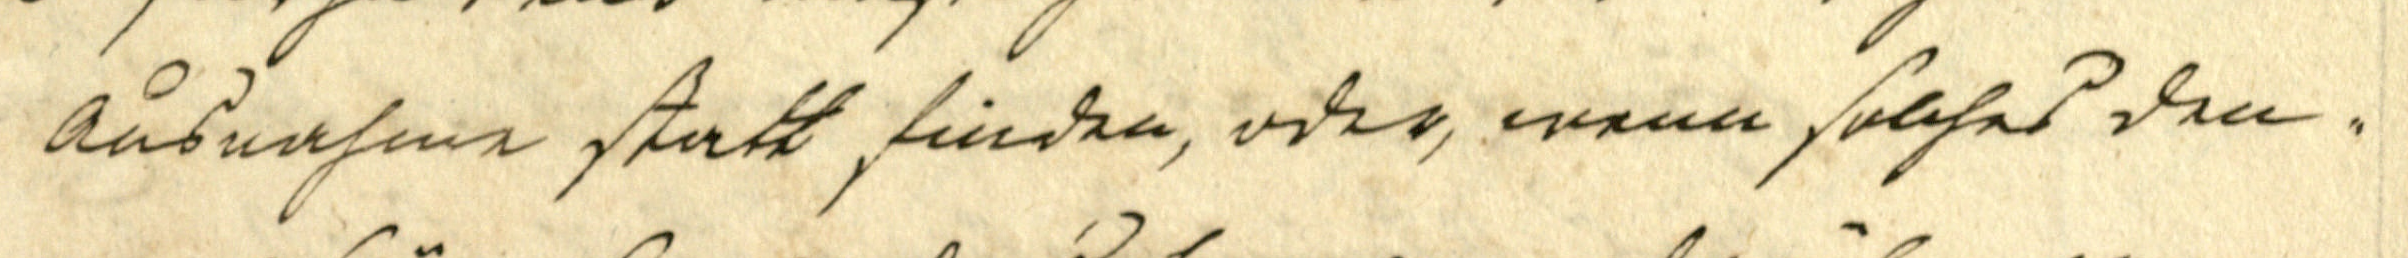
Ausnahme statt finden, oder, wenn solches den¬
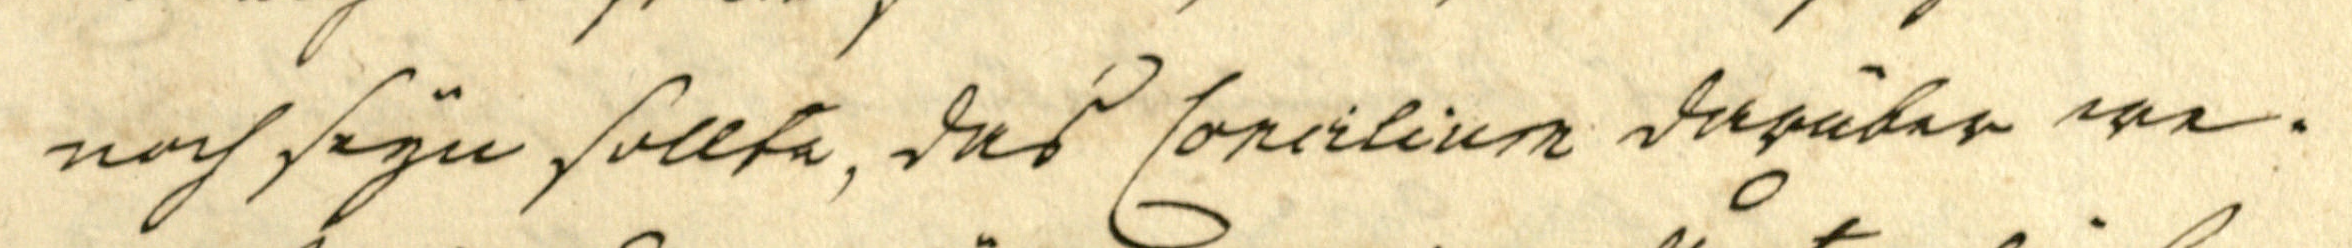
noch seÿn sollte, das Concilium darüber we¬
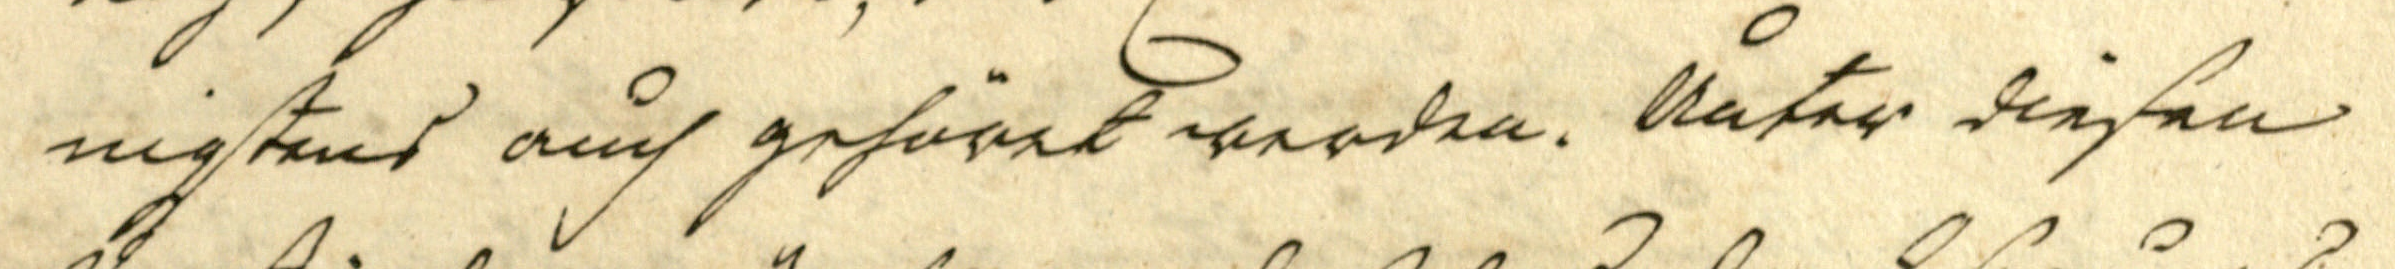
nigstens auch gehöret werden. Unter diesen
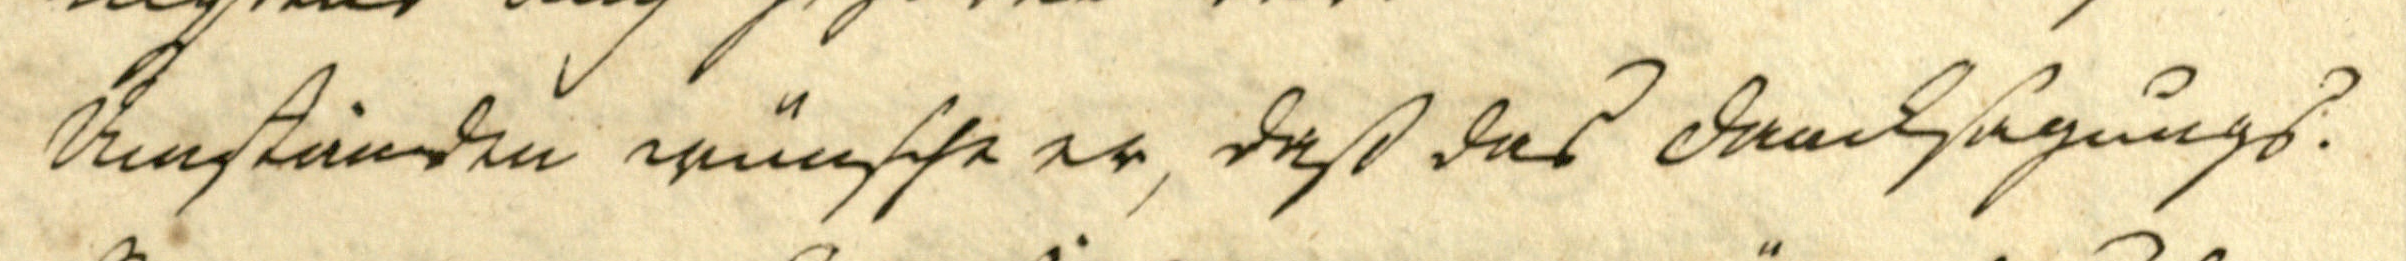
Umständen wünsche er, daß das Dancksagungs¬
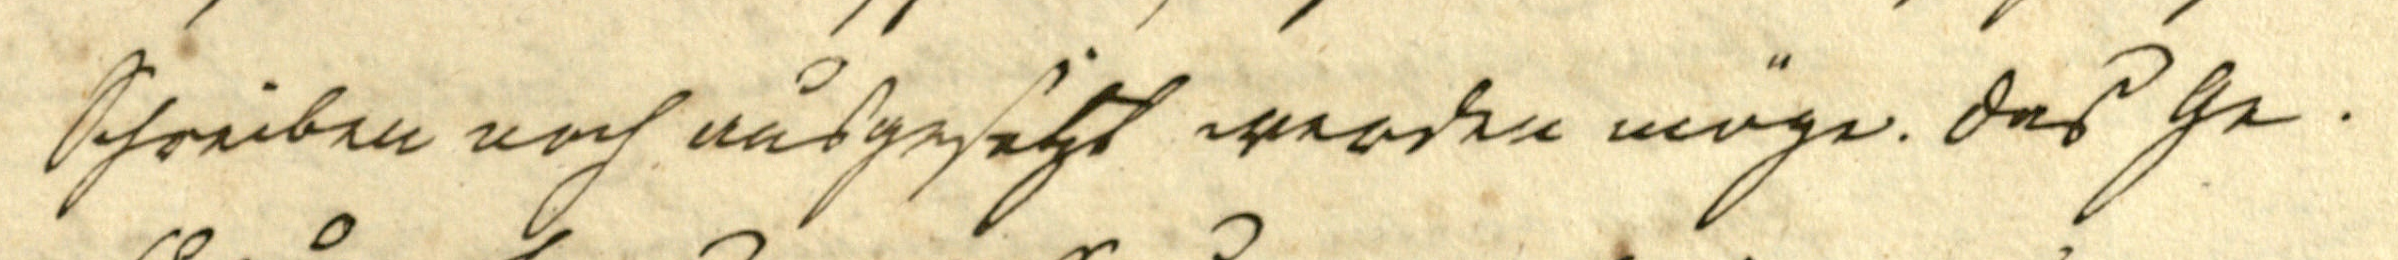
Schreiben noch ausgesetzt werden möge. Das Ge¬
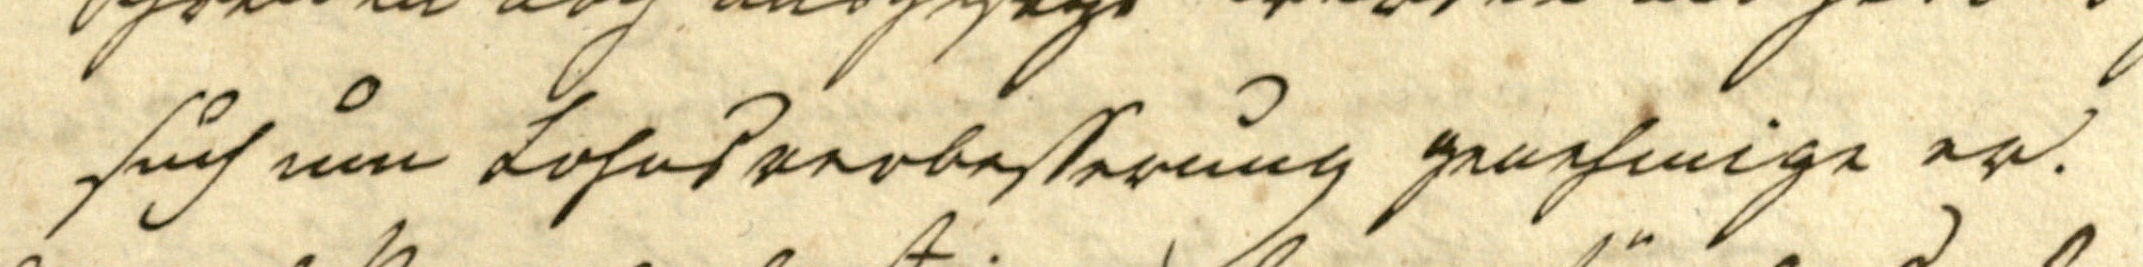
such um Lohns Verbesserung genehmiget er.
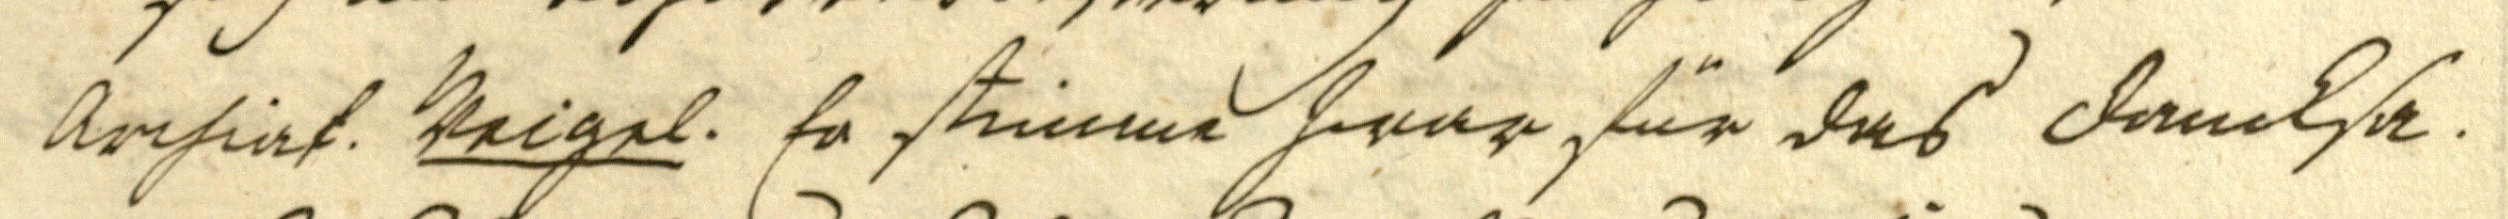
Archiat. Weigel. Er stimme zwar für das Dancksa¬
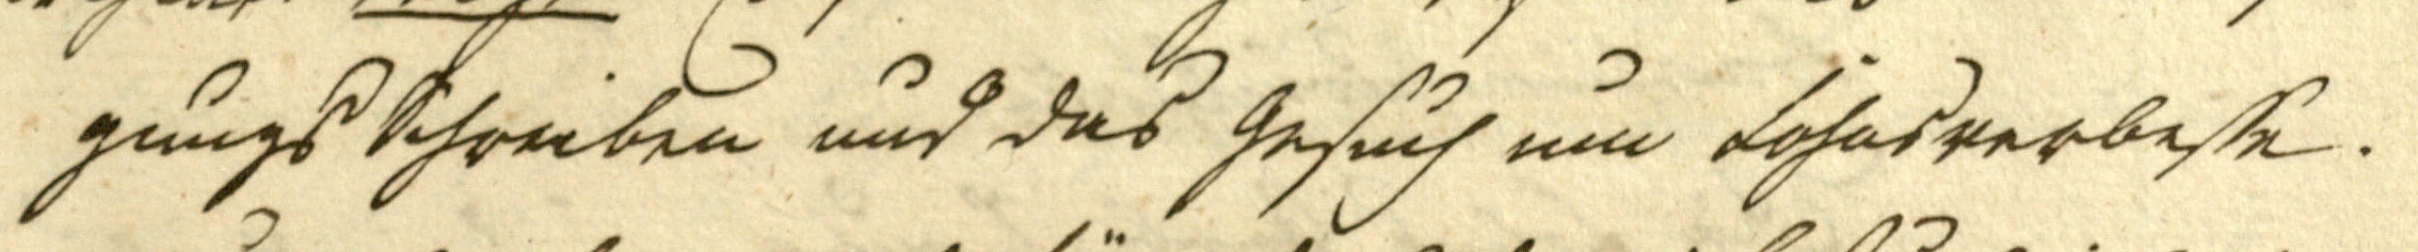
gungs Schreiben und das Gesuch um Lohnsverbesse-
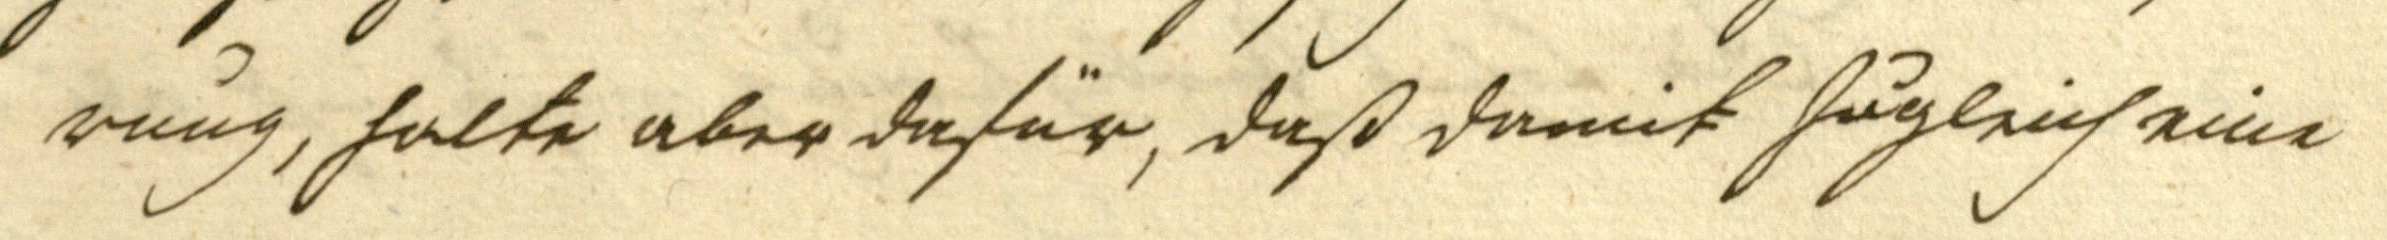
rung, halte aber dafür, daß damit zugleich eine
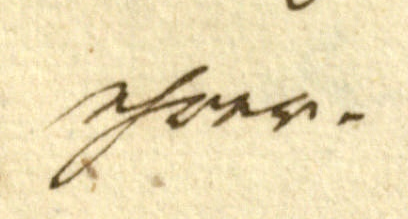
ehrer
